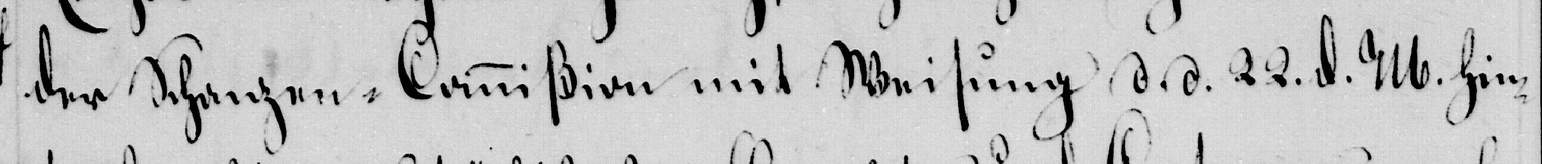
der Schanzen-Commißion mit Weisung d. d. 22. d. M. hin¬
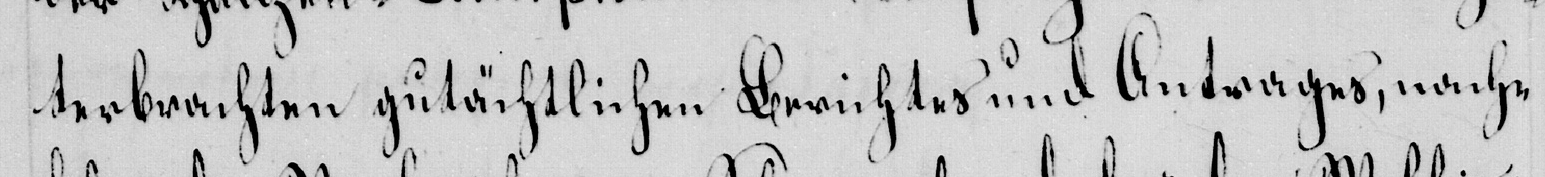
terbrachten gutächtlichen Berichtes und Antrages, nach¬
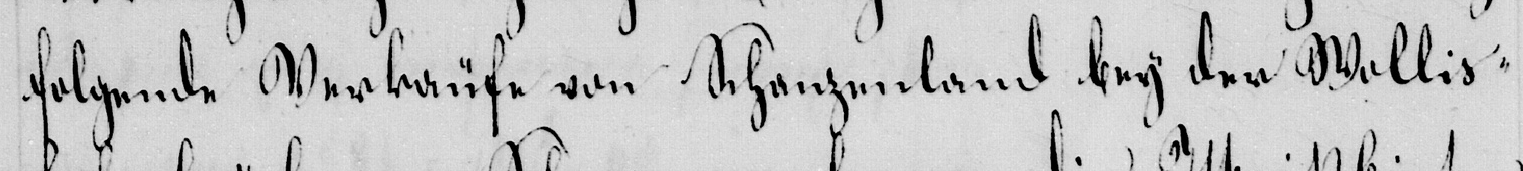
folgende Verkäufe von Schanzenland bey der Wollis¬
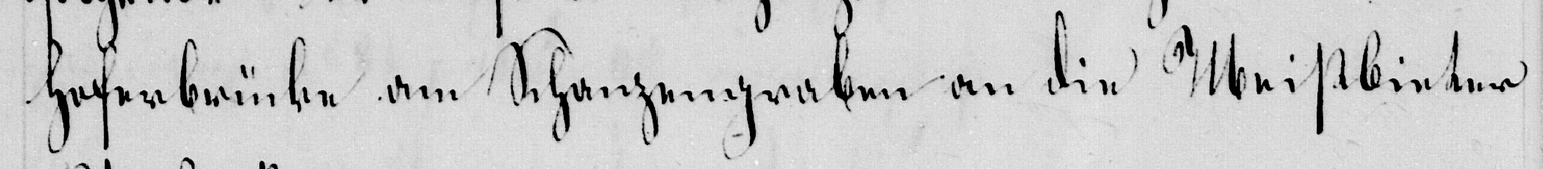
hoferbrücke am Schanzengraben an die Meistbieter
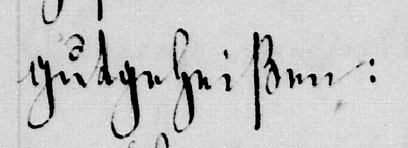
gutgeheißen:
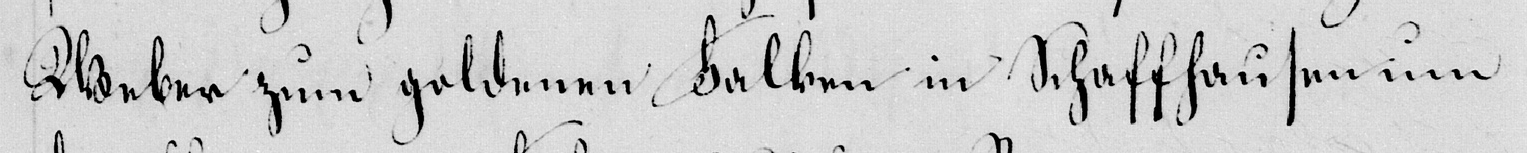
Weber zum goldenen Falken in Schaffhausen um
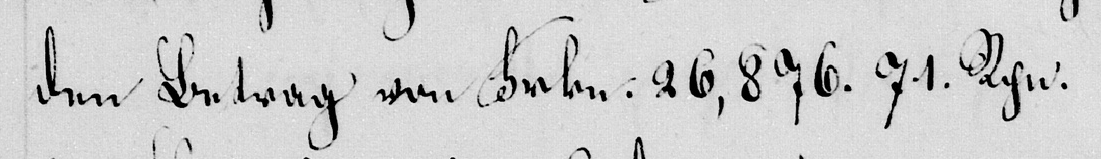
den Betrag von Frkn: 26,876. 71. Rpn.
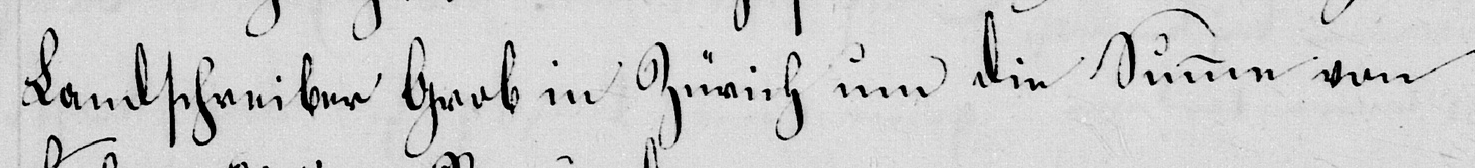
Landschreiber Grob in Zürich um die Summe von
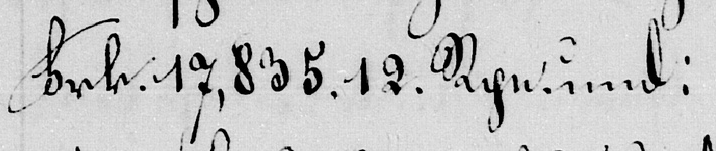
Frk. 17,835. 12. Rpn. und:
